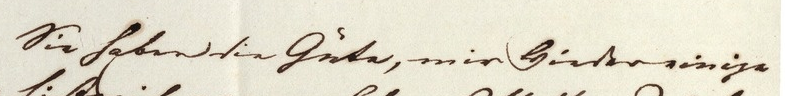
Sie haben die Güte, mir wieder einige
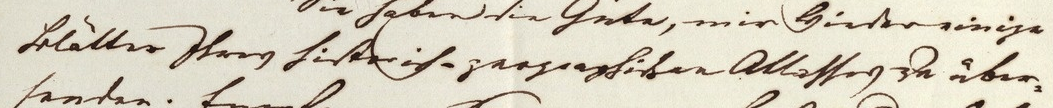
Blätter Ihres historisch-geographischen Atlasses zu über-
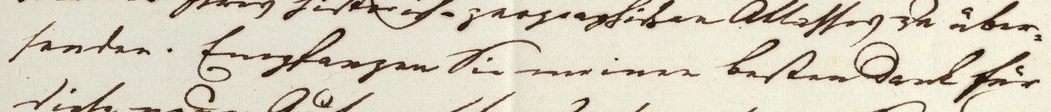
senden. Empfangen Sie meinen besten Dank für
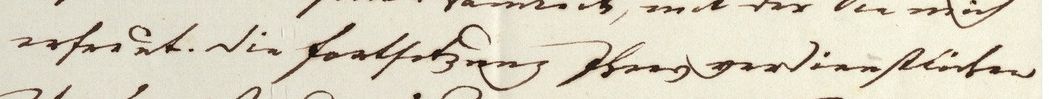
erfreut. Die Fortsetzung Ihres verdienstlichen
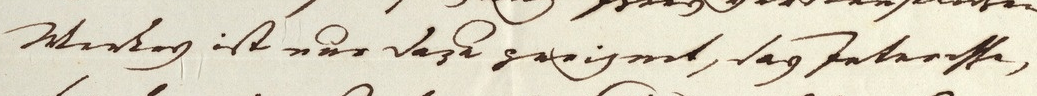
Werkes ist nur dazu geeignet, das Interesse,
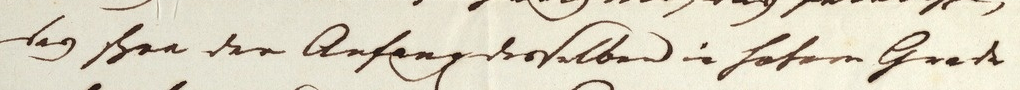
das schon der Anfang desselben in hohem Grade
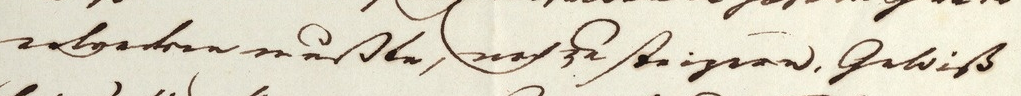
erwecken mußte, noch zu steigern. Gewiß
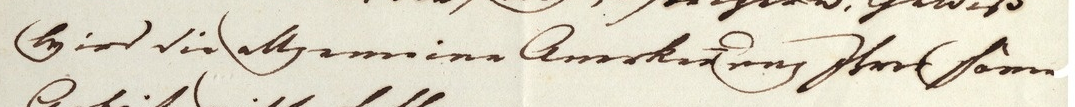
wird die allgemeine Anerkennung Ihrer schönen
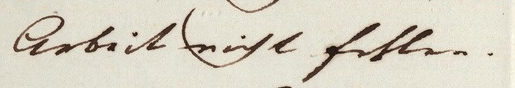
Arbeit nicht fehlen.
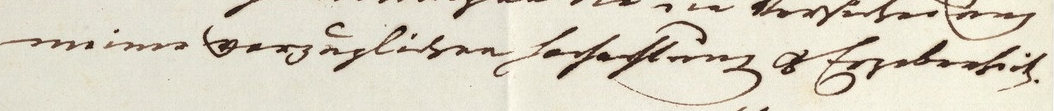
meiner vorzüglichen Hochachtung & Ergebenheit
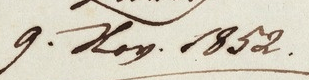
9. Nov. 1852.
